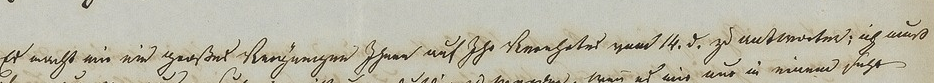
Es macht mir ein großes Vergnügen Ihnen auf Ihr Verehrtes vom 14. d. zu antworten; ich muß
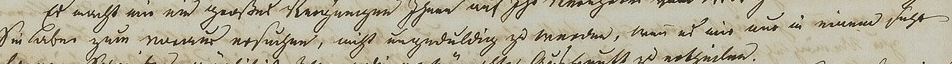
Sie aber zum voraus ersuchen, nicht ungeduldig zu werden, wenn es mir nur in einem sehr
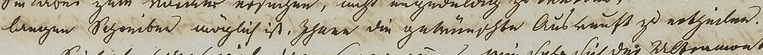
langen Schreiben möglich ist, Ihnen die gewünschte Auskunft zu ertheilen.
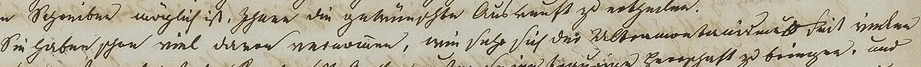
Sie haben schon viel davon vernommen, wie sehr sich der Ultramontanismus seit vielen
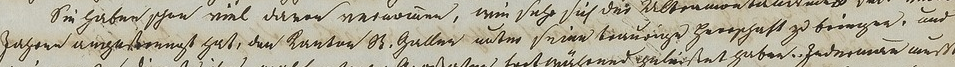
Jahren angestrengt hat, den Kanton St. Gallen unter seine traurige Herrschaft zu bringen, und
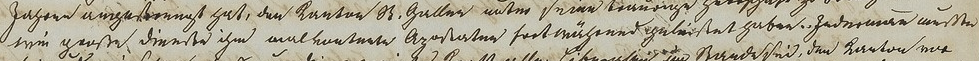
wie große Dienste ihm malkontente Apostaten fortwährend geleistet haben. Jedermann mußte
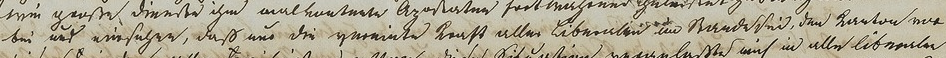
bei uns einsehen, daß nur die vereinte Kraft aller Liberalen im Stande sei, den Kanton vor
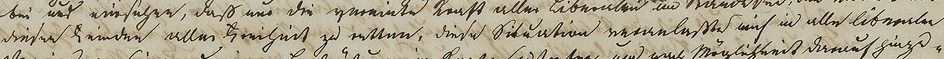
diesen Feinden aller Freiheit zu retten. Diese Situation veranlaßte mich in alle liberalen
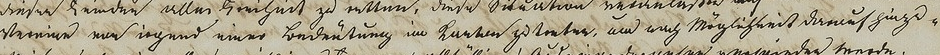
Vereine von irgend einer Bedeutung im Kanton zu treten, um nach Möglichkeit darauf hinzu-
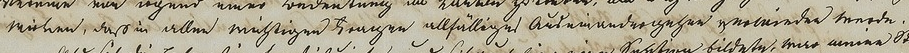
wirken, daß in allen wichtigen Fragen allfälliges Auseinandergehen vermieden werde.
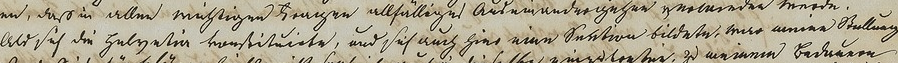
Als sich die Helvetia konstituirte, und sich auch hier eine Sektion bildete, war meine Stellung
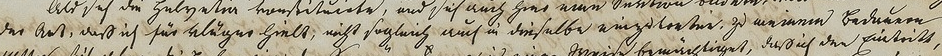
der Art, daß ich für klüger hielt, nicht sogleich auch in dieselbe einzutreten. Zu meinem Bedauern
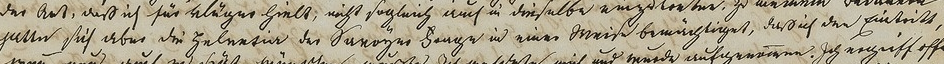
hatte sich aber die Helvetia der Savoyer Frage in einer Weise bemächtiget, daß ich den Eintritt,
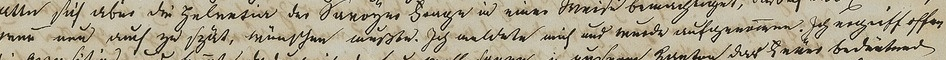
wenn nun auch zu spät, wünschen mußte. Ich meldete mich und wurde aufgenommen. Ich ergriff offen
